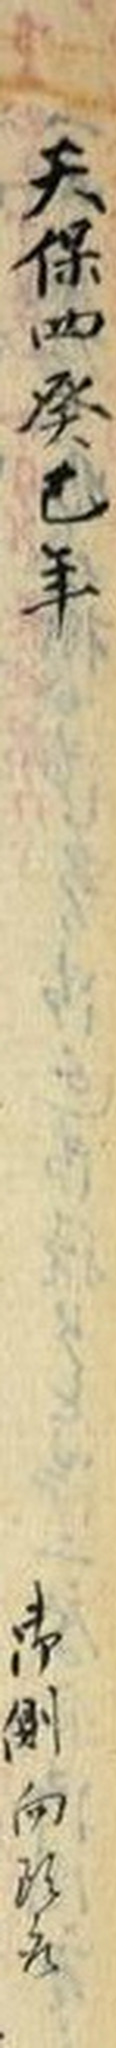天保四癸巳年御側向頭取
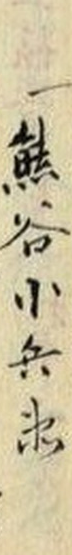熊谷小兵衛
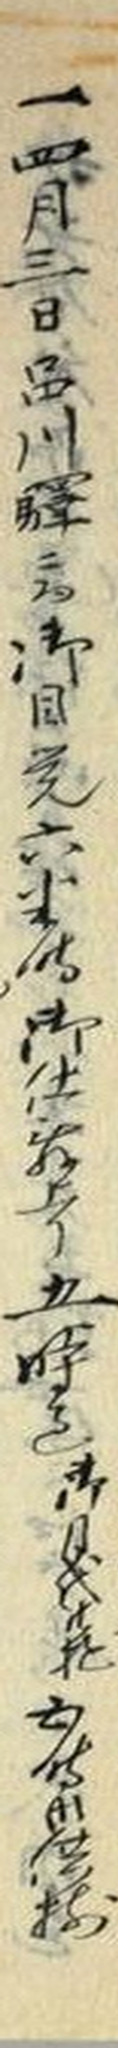一四月三日品川駅ニ而御目覚六半時御仕舞上り五時過御月代被遊五時御供揃
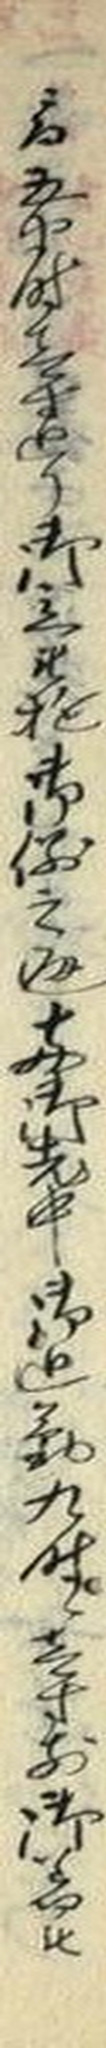ニ而五半時壱寸廻り御立被遊御例之通両御老中御廻勤九時壱寸前御着被
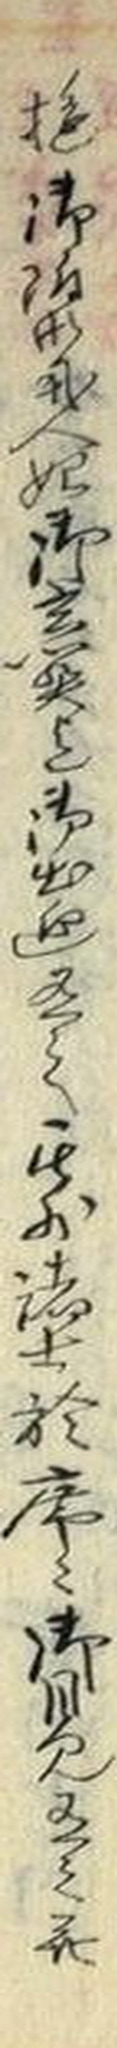遊御附御用人始御玄関迄御出迎有之其外諸士於席々御目見有之并
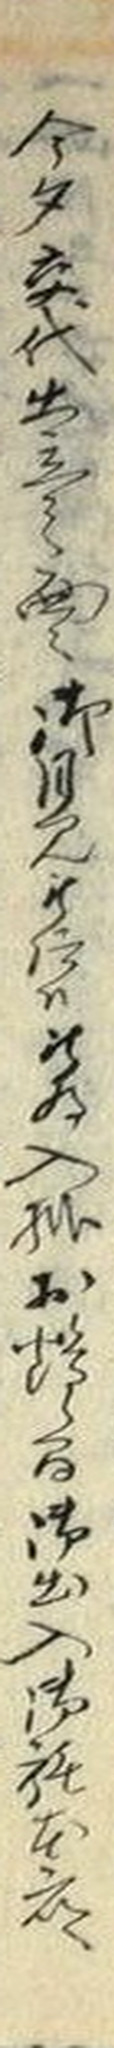今夕交代出立之面々御目見被仰付被為入掛於鶴之間御出入御旗本衆へ
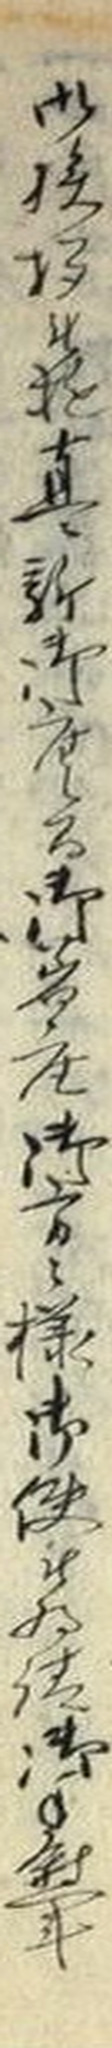御挨拶被遊直ニ新御座之間御着座御方々様御使被為請御手慰斗
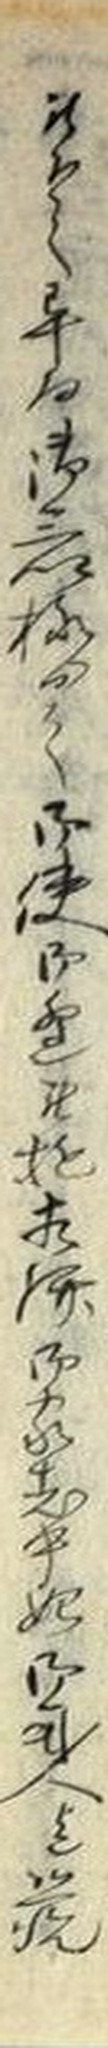被下之畢而御三卿様ゟ之御使御逢被遊相済御家老中始御用人迄恐悦
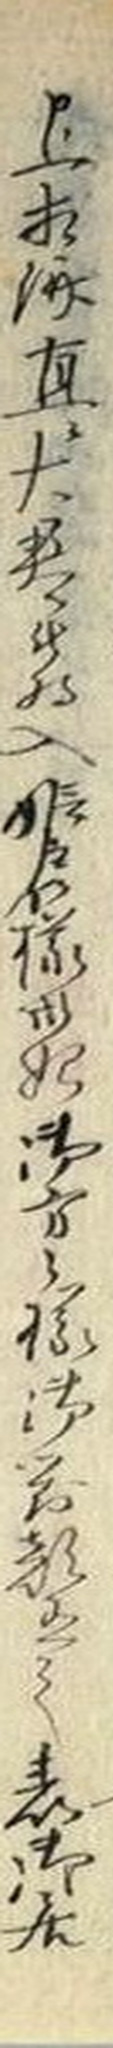申上相済直ニ大奥へ被為入姫君様御始御方々様御対顔有之表御居
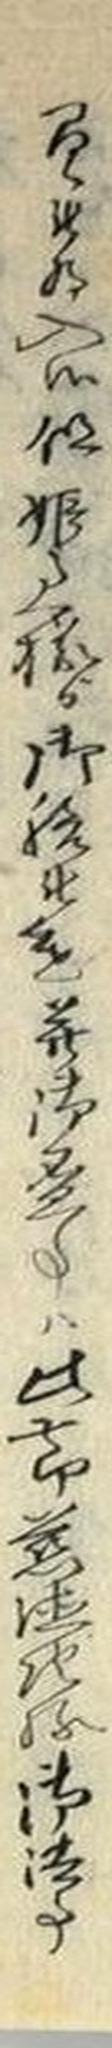間へ被為入候但姫君様ゟ御膳被進并御盃事ハ此節慈徳院様御法事
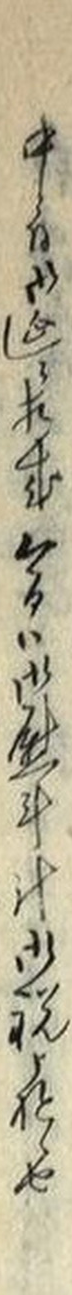中ニ付御延ニ相成今日ハ御熨斗計御祝被遊候由
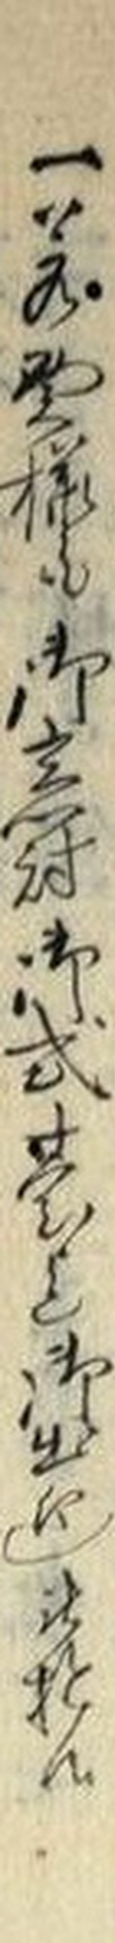一若殿様も御玄関御式台迄御出迎被遊候
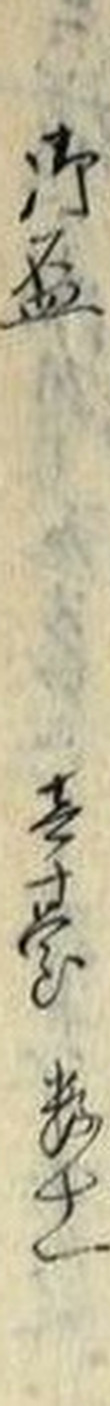御盃壱台数十一

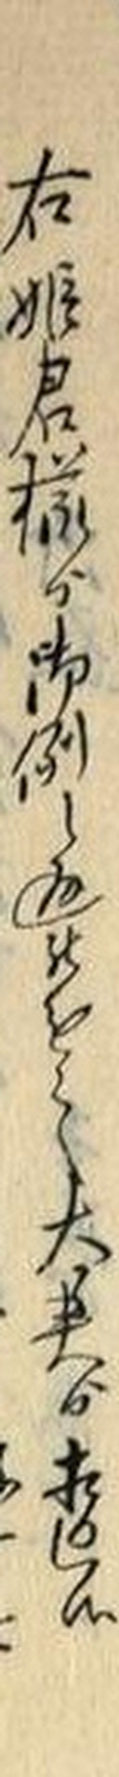右姫君様ゟ御例之通被進之大奥ゟ相廻候
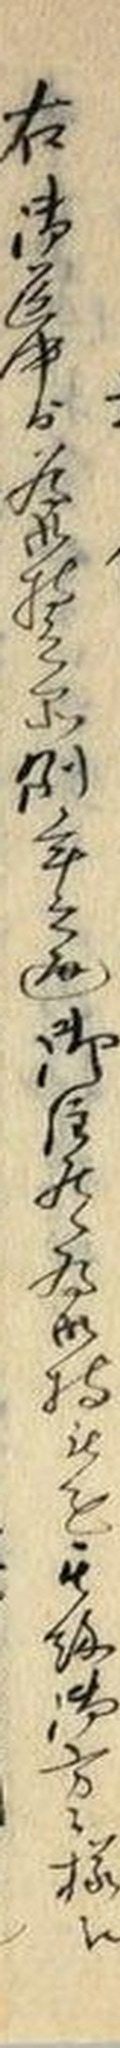右御道中ゟ為御持之品例年之通御住居へ為御持被進其餘御方々様江
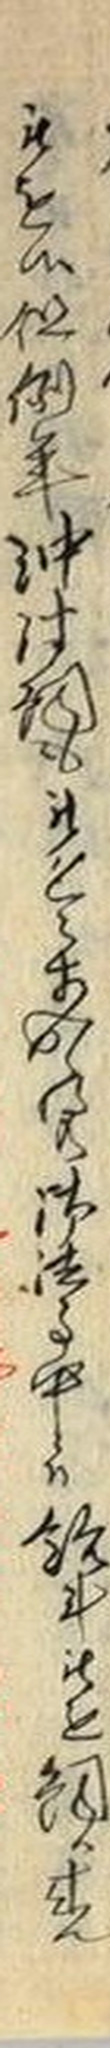被進候但例年沖津鯛も被進ニ相成候得共御法事中ニ付飴斗被進鯛ハ来ㇽ
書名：少傅日録抄（斉承付側向頭取日記、在府）
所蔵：福井県文書館 Fukui Prefectural Archives
